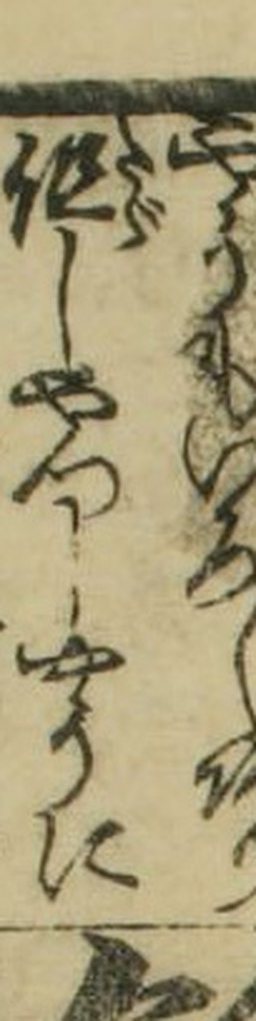但しやつしやうに
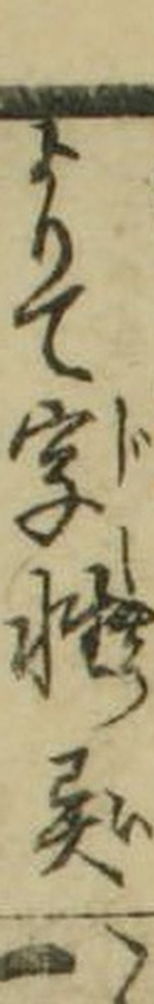よりて字性異
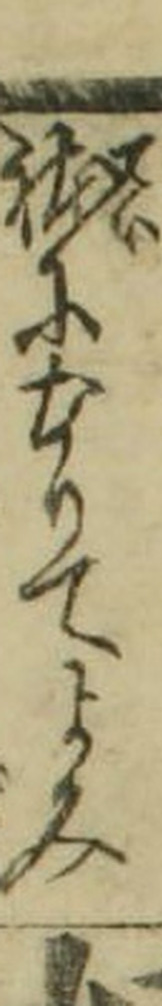体になりてよみ
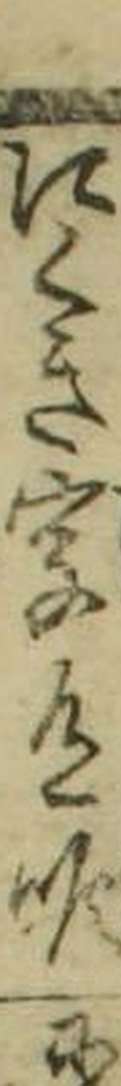にくき字有順
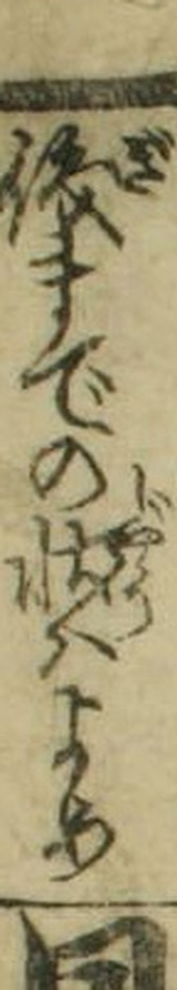儀までの状はよめ
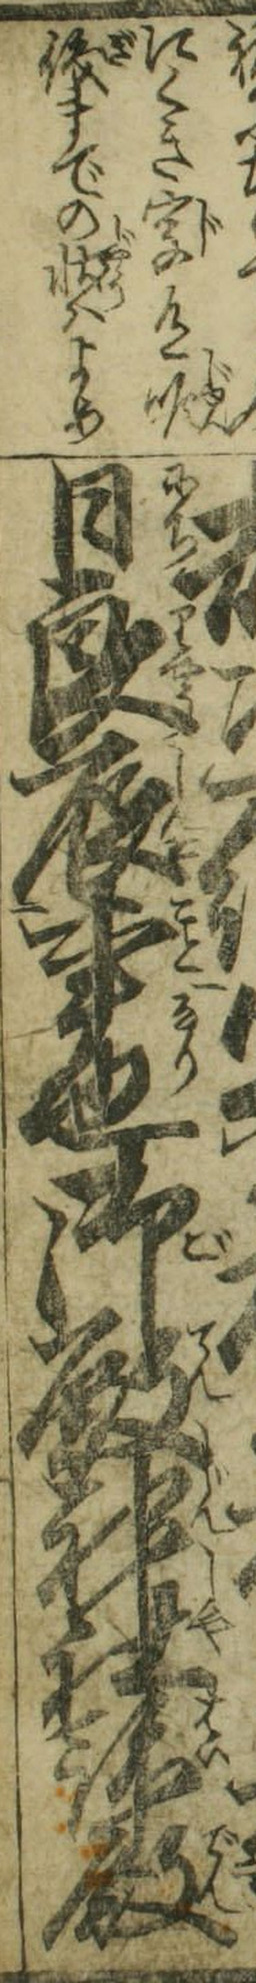儀までの状はよめ

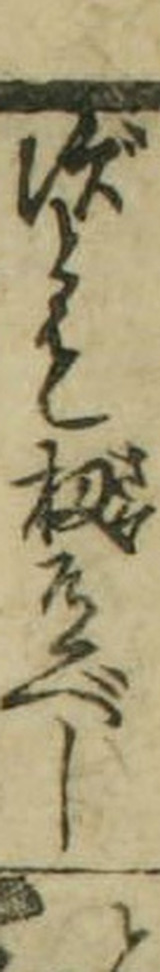ずとも扨有べし
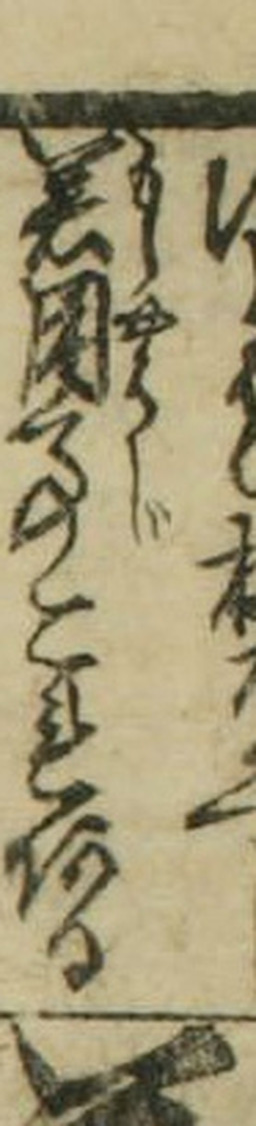若用事これある
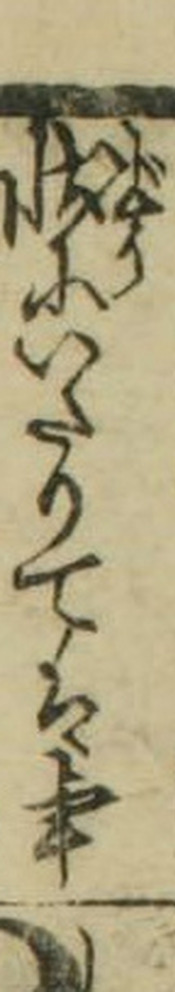状にいたりては事
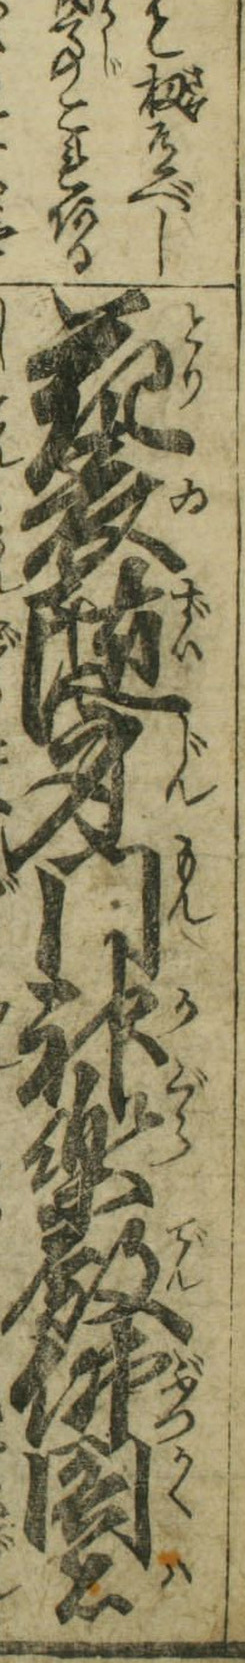花衣随身門神楽殿仏閣者
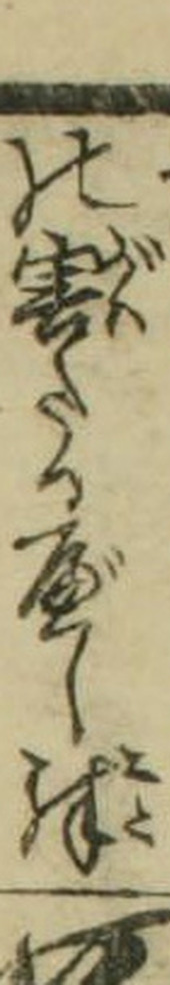の害たるべし殊
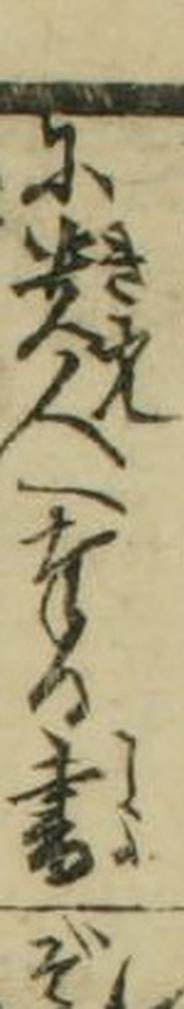に貴人へ奉る書
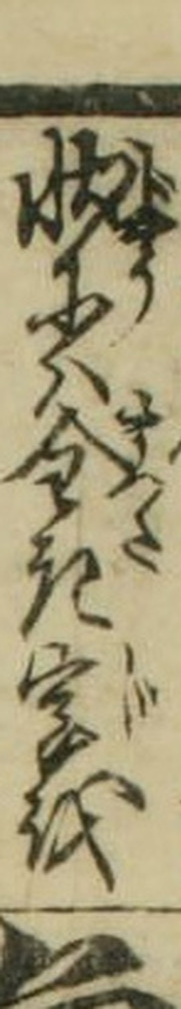状には全き字を
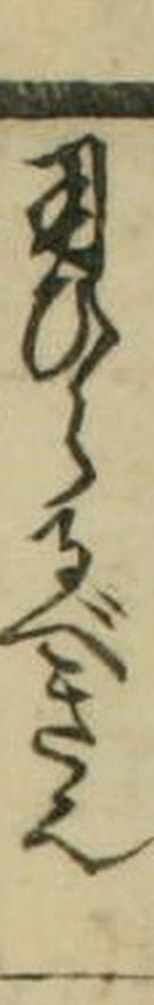用ひらるべき也
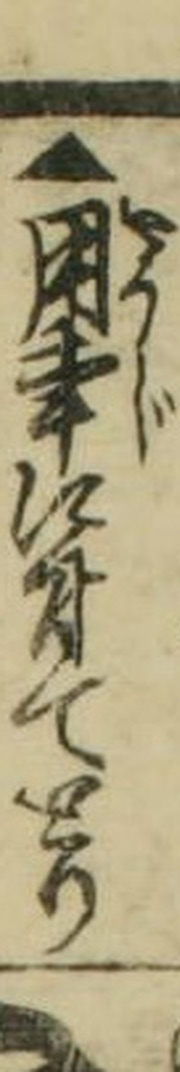▲用事に付てとり
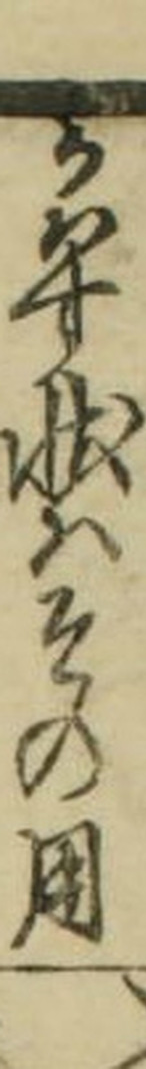かはす状はその用
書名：増補職人往来
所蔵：東京学芸大学教育コンテンツアーカイブ
